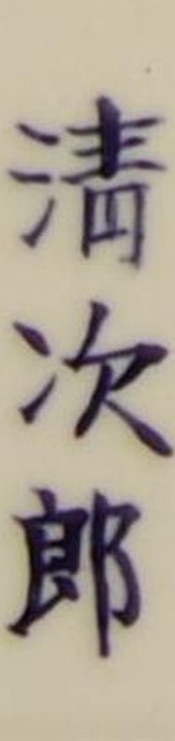清次郎

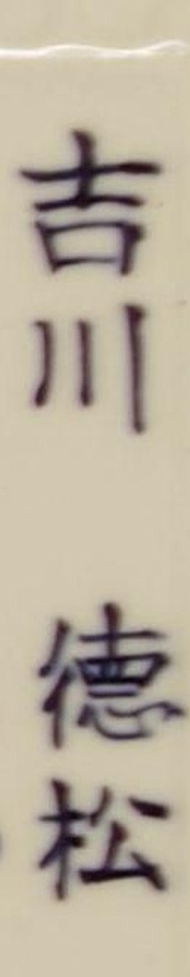吉川徳松
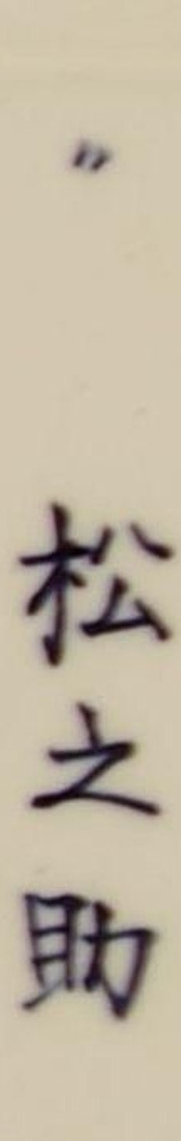松之助
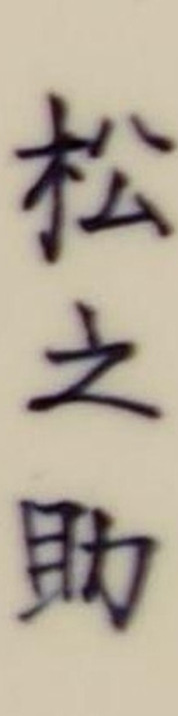松之助
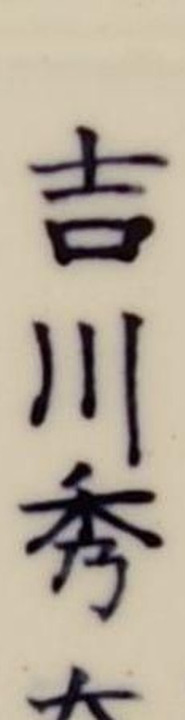吉川光
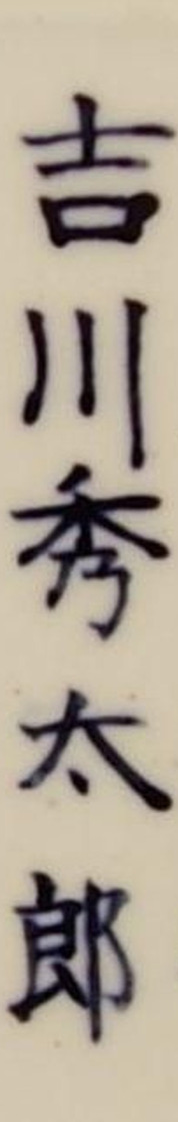吉川秀太郎
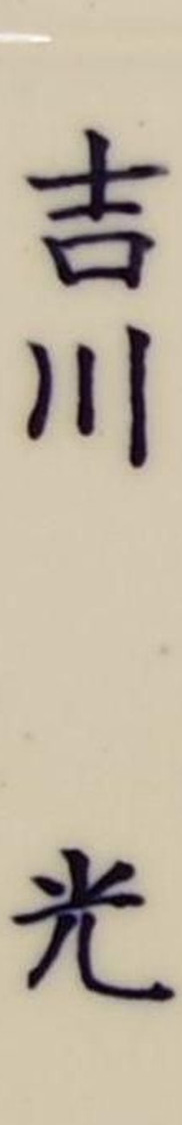吉川光
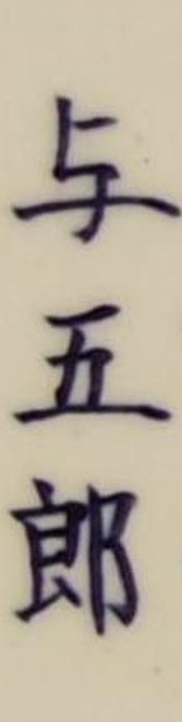与五郎
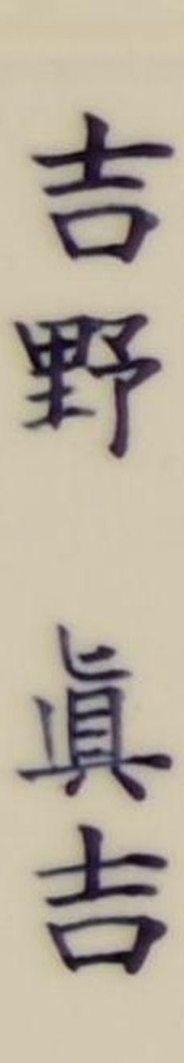吉野真吉

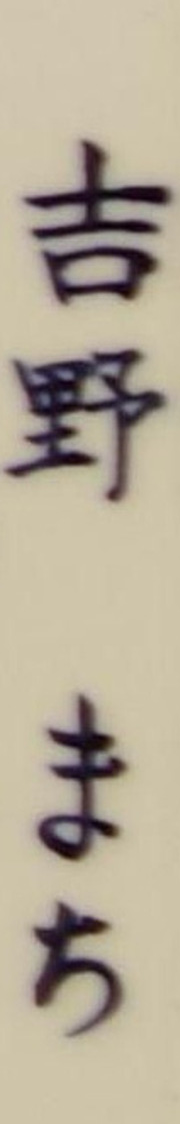吉野まち
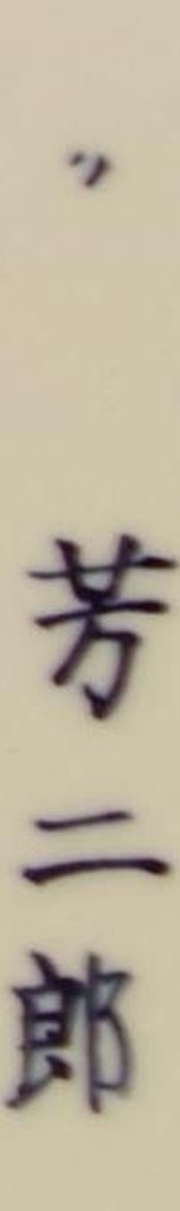芳二郎
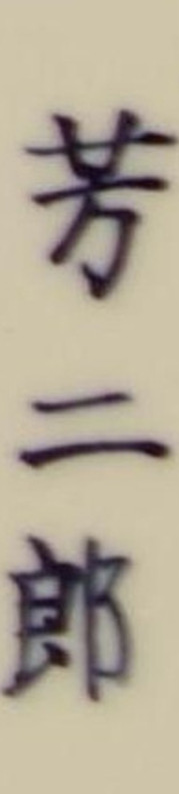芳二郎
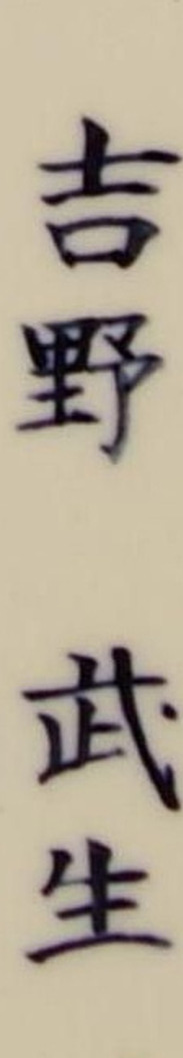吉野武生
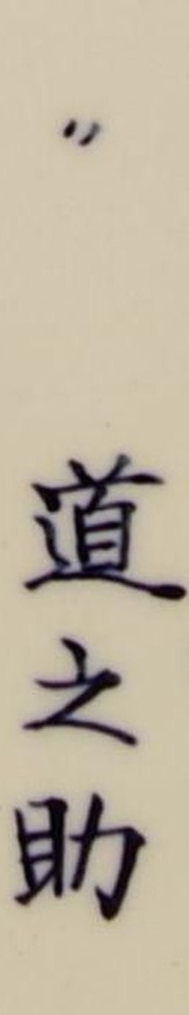道之助
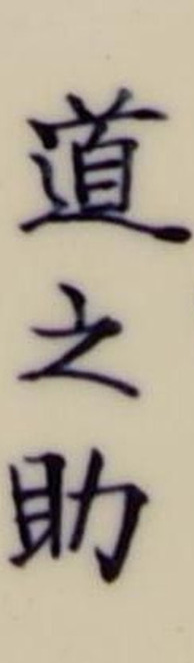道之助
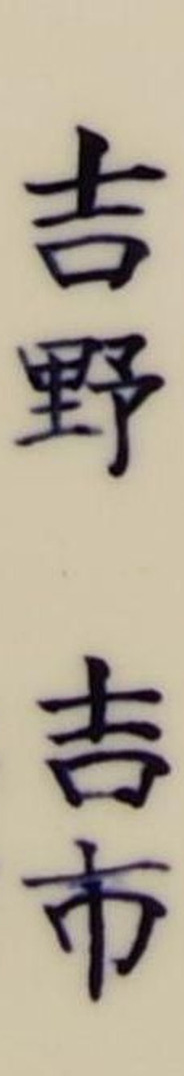吉野吉市
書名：A~D
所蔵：koyasan kongobuji
